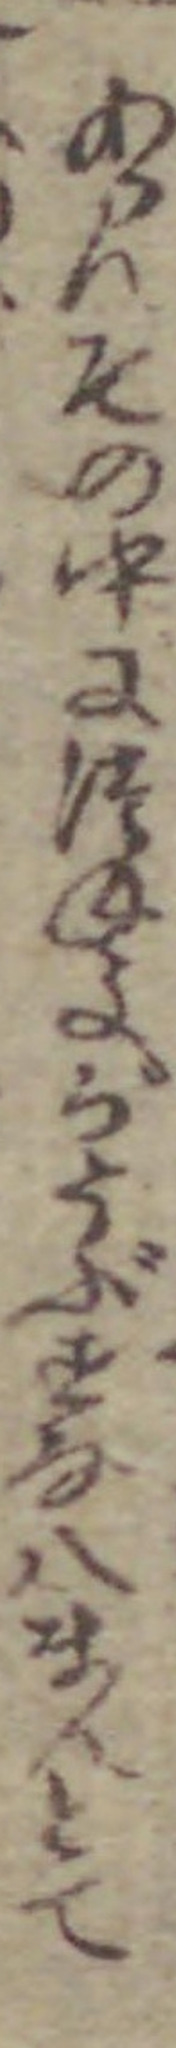あらんその中につねよがうぶすな八まんとて
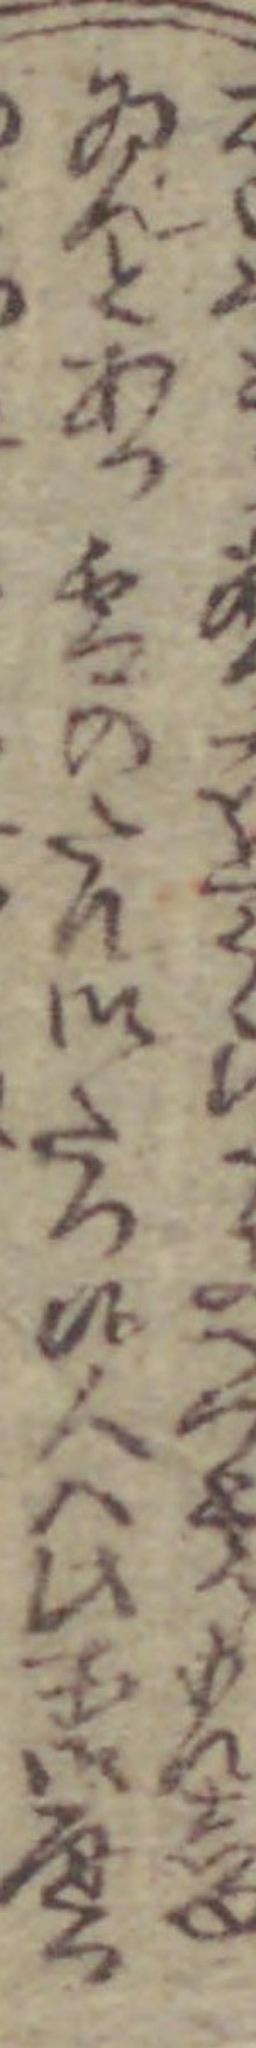ゐんとあり雪のたんをたつ候人は此所御通り
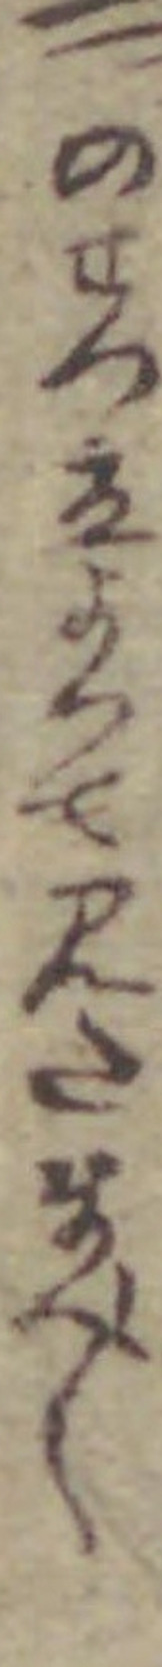のせつ立よつて見たまへ
